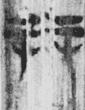幵
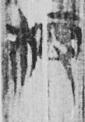○（耨）
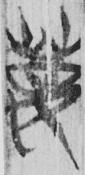菨（鍤）
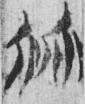○（謁）
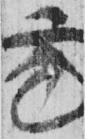而
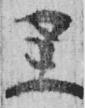坐
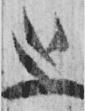之
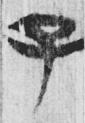子
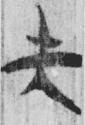○（堯）
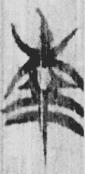南
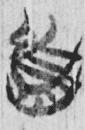面
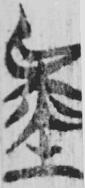○（舜）
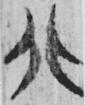北
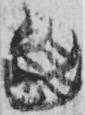面
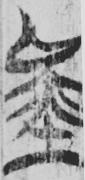○（舜）
